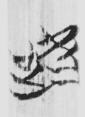{足欠}
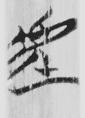𫊟
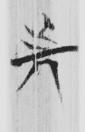先
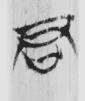君
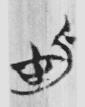{才匕}
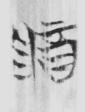𨟻
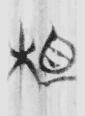相
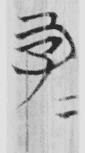乳=
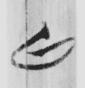㠯（以）
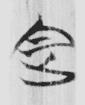定
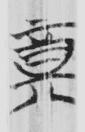奠
